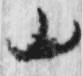山
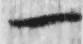一
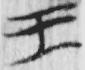王
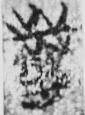戠
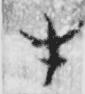牛
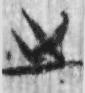之
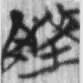陵
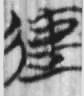連
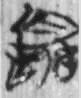囂
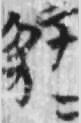豕冢
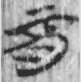酉
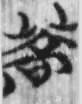蒿
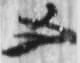之
